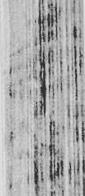堇（謹）
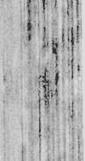口
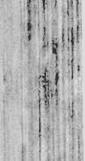口
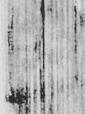生
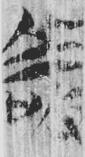敬
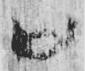口
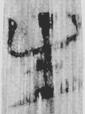生
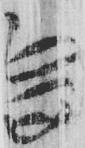○（怠）
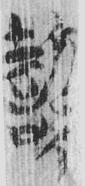○（慎）
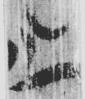之
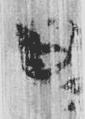口
